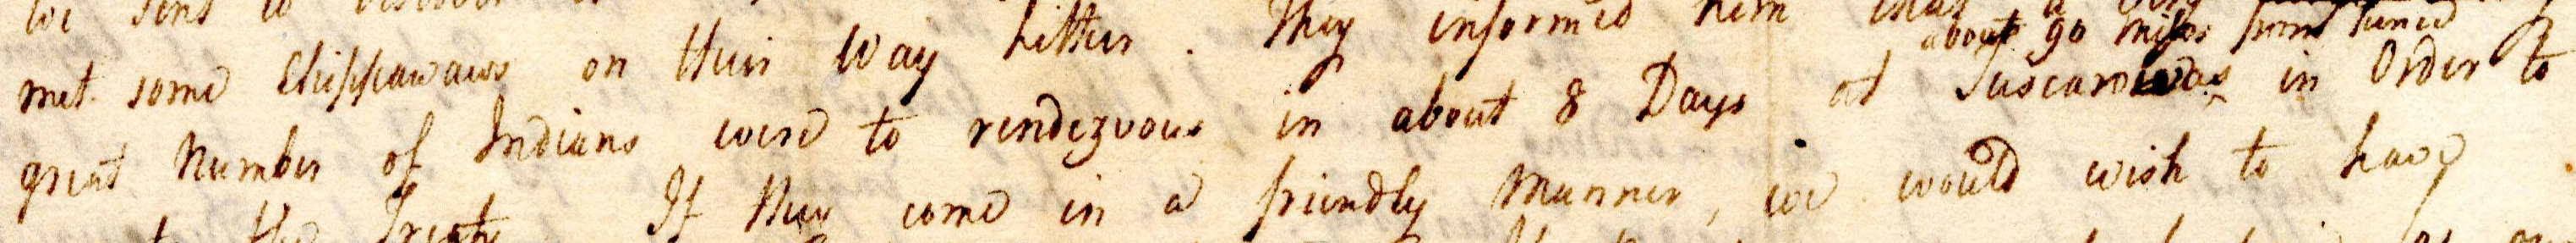great number of Indians were to rendezvous in about 8 Days at Tuscarawas in Order to
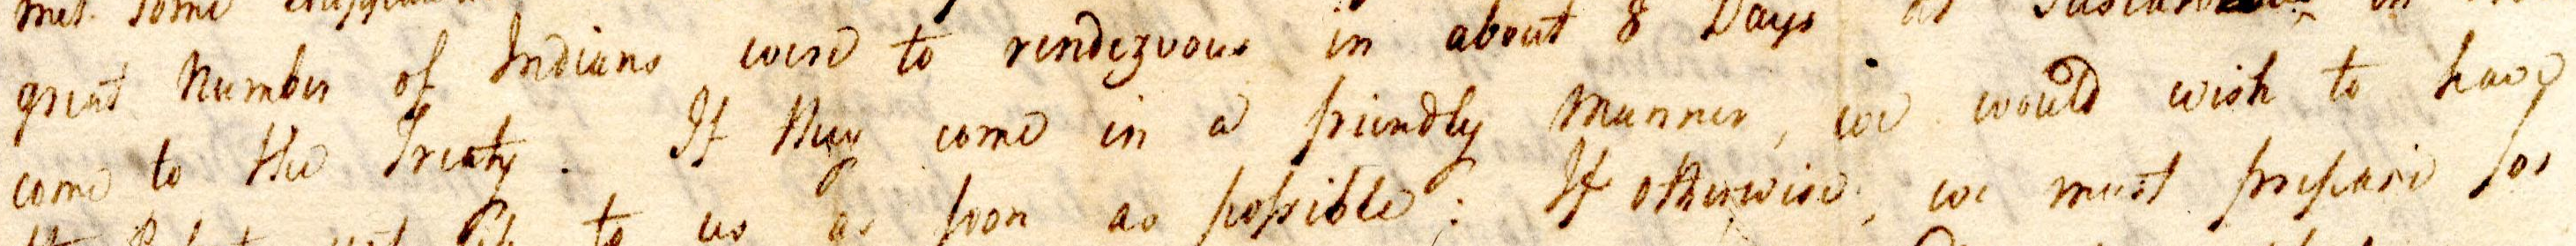come to the Treaty. If they come in a friendly manner we would wish to have
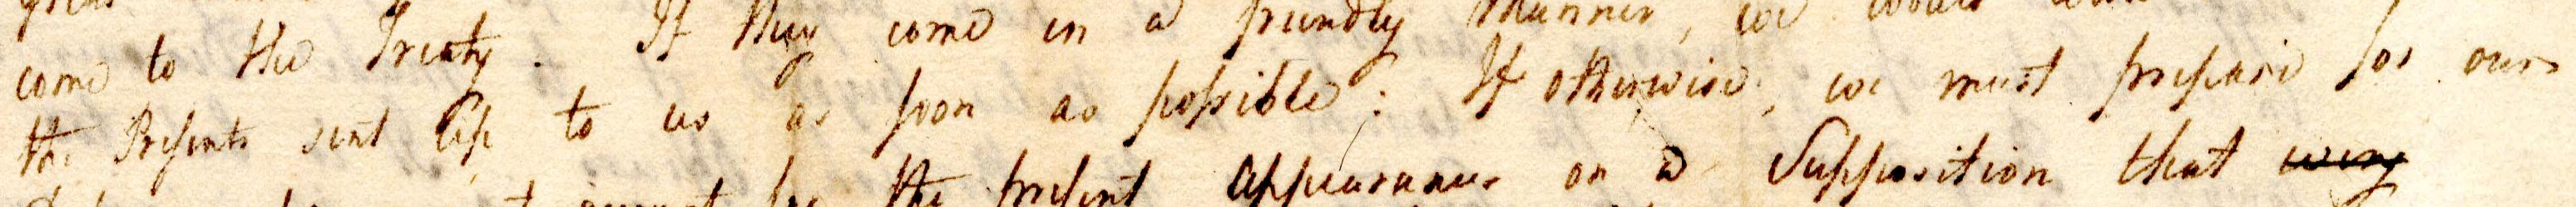the Presents sent to us as soon as possible: If otherwise, we must prepare for our
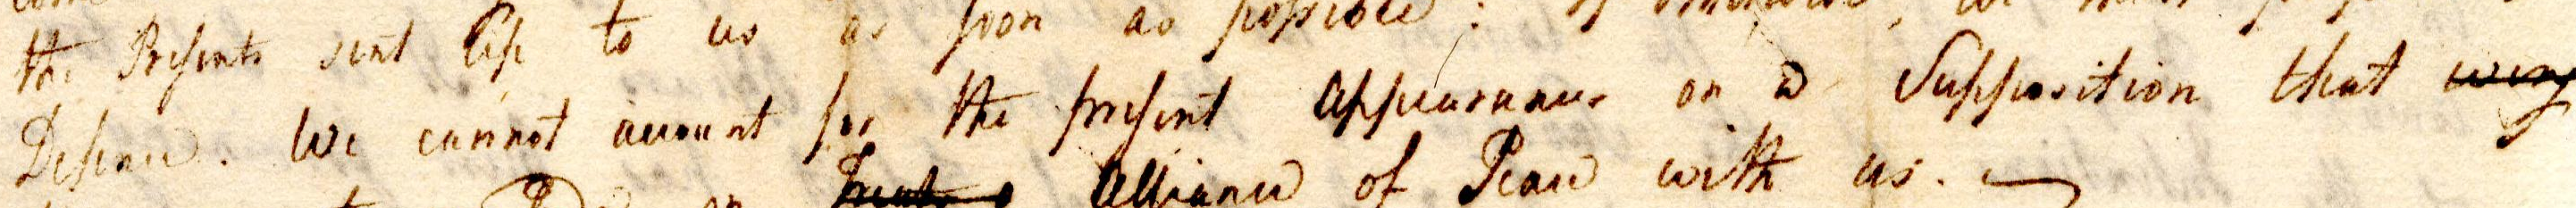Defense. We cannot account for the present Appearance on a Supposition that every
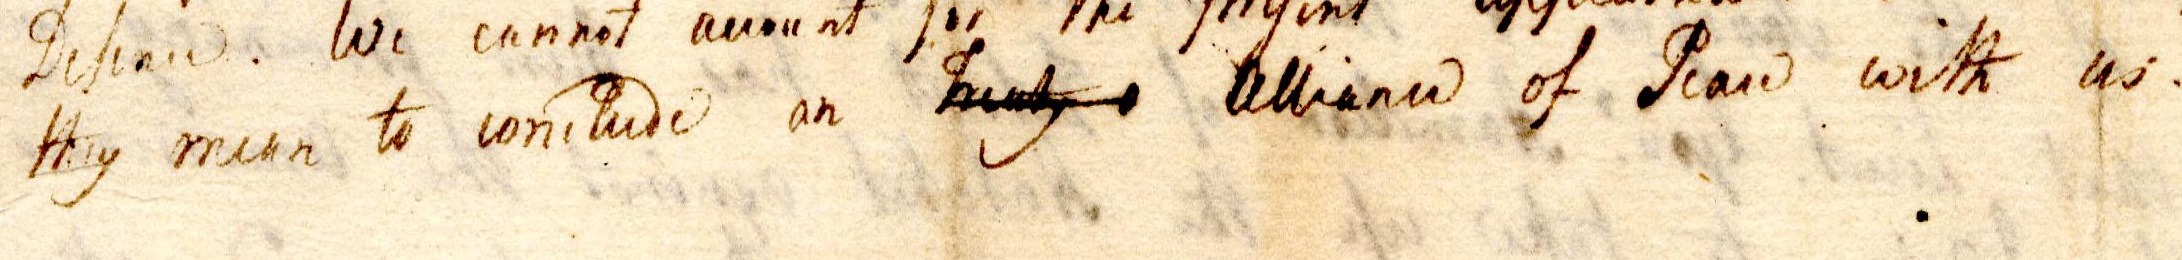they mean to conclude an [Treaty] Alliance of Peace with us.-
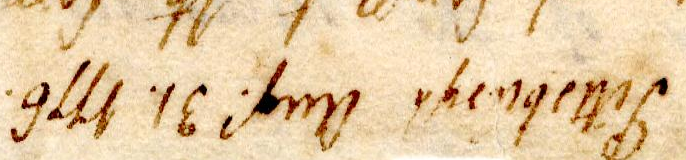Pittsburgh Aug^t. 31. 1776.
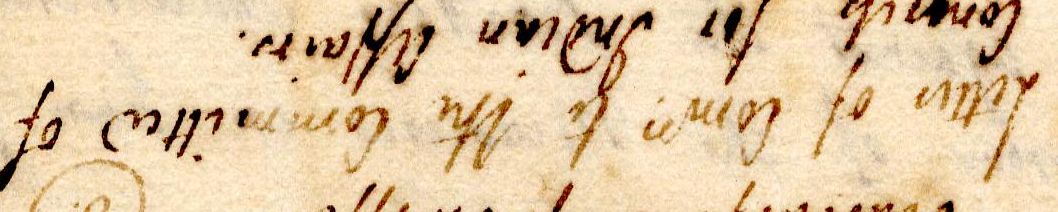Letter of Com^r. to the Committee of
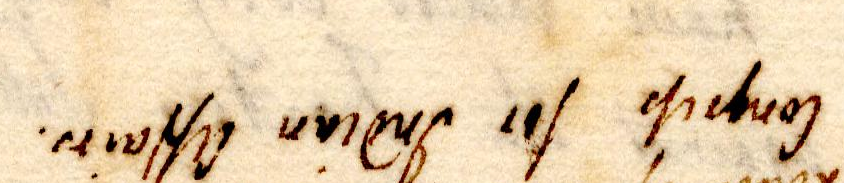Congress for Indian Affairs.
